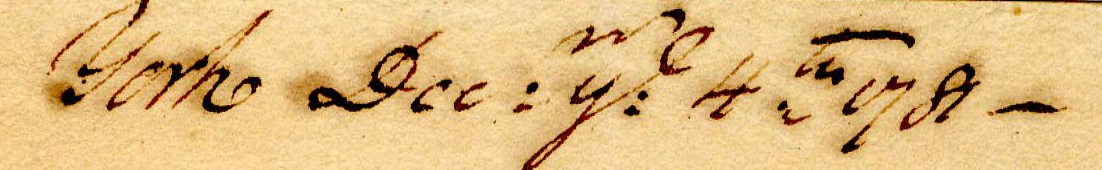York Dec^r: y^e: 4^th. 1781
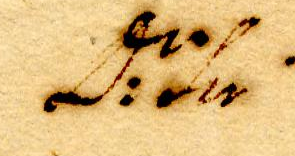D^r Sir
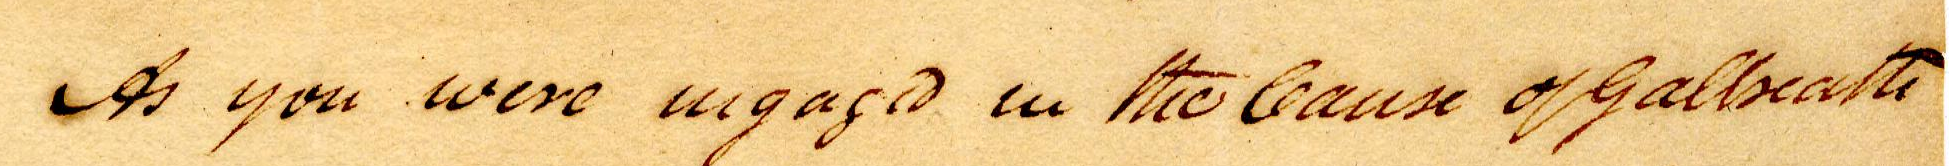As you were engaged in the Cause of Galbreath
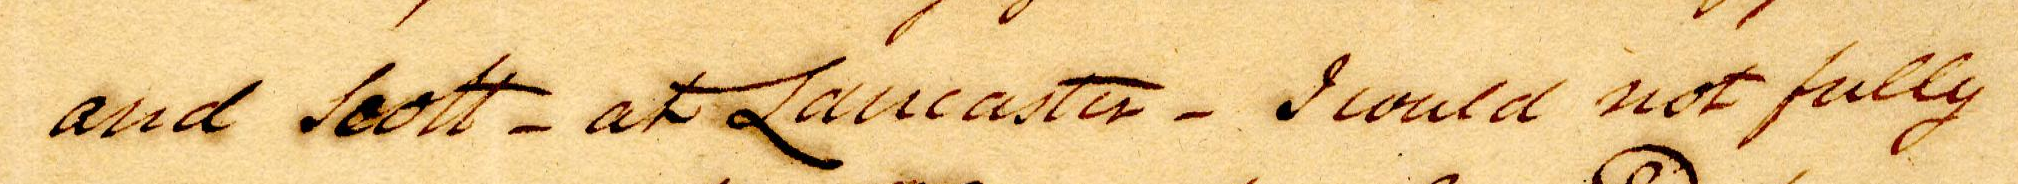and Scott- at Lancaster- I could not fully
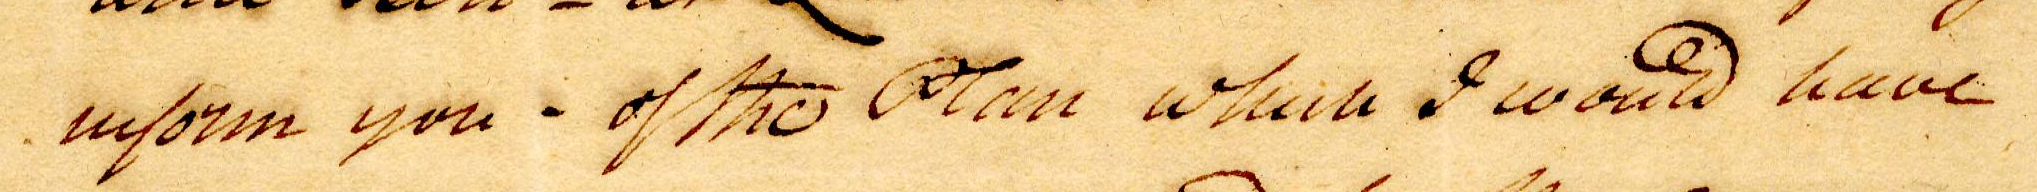inform you- of the Plan which I would have
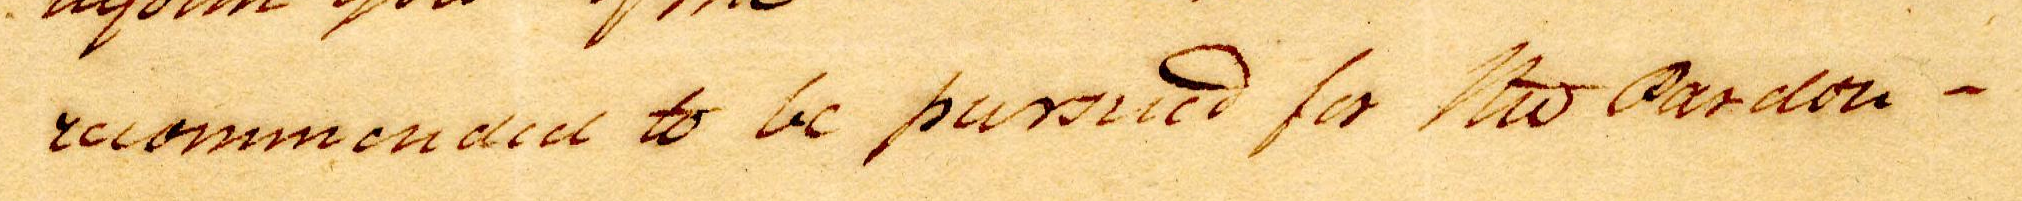reccommended to be pursued for the Pardon
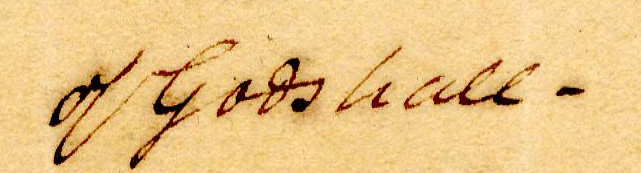of Gods hall
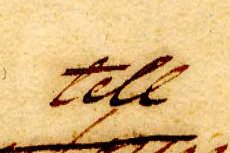tell
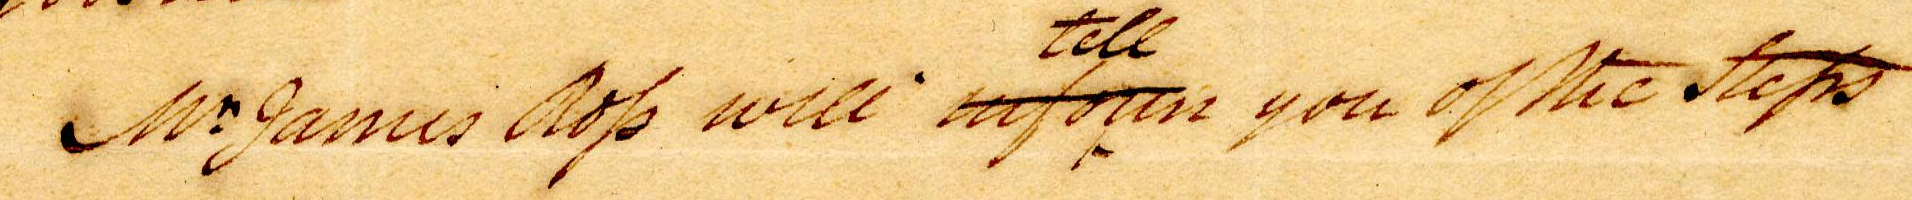M^r. James Ross will inform ^ you of the steps
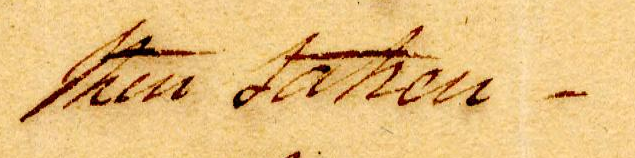then taken
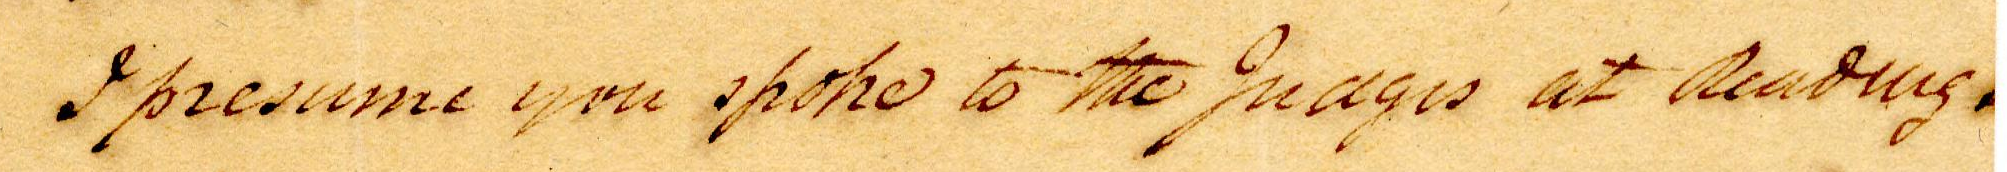I presume you spoke to the Judges at Reading
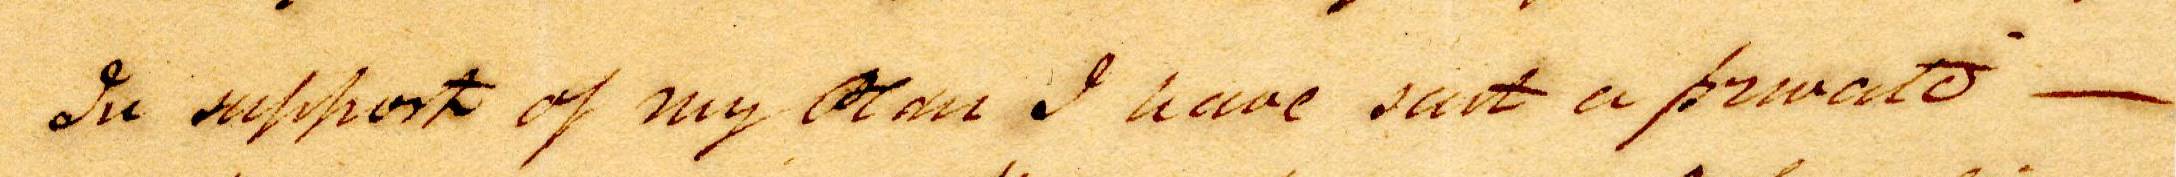In support of my Order I have sent a private
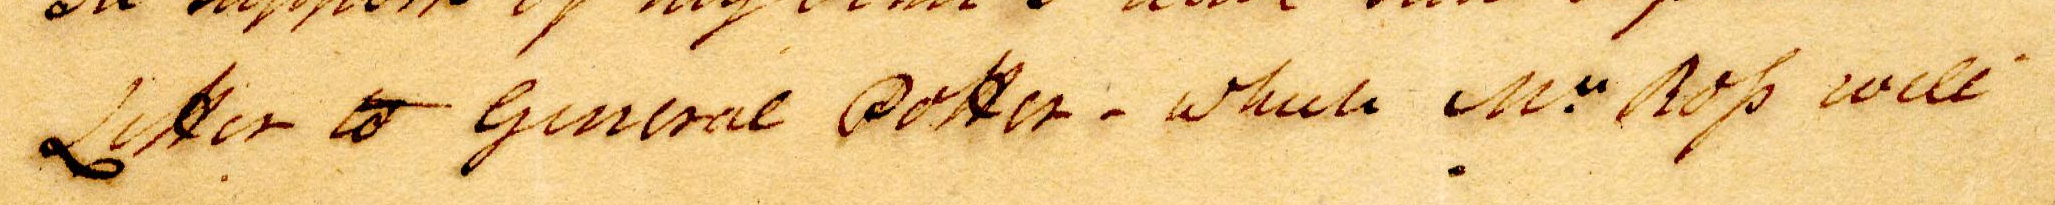Letter to General Potter- which M^r Ross will
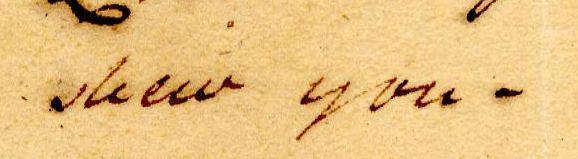shew you
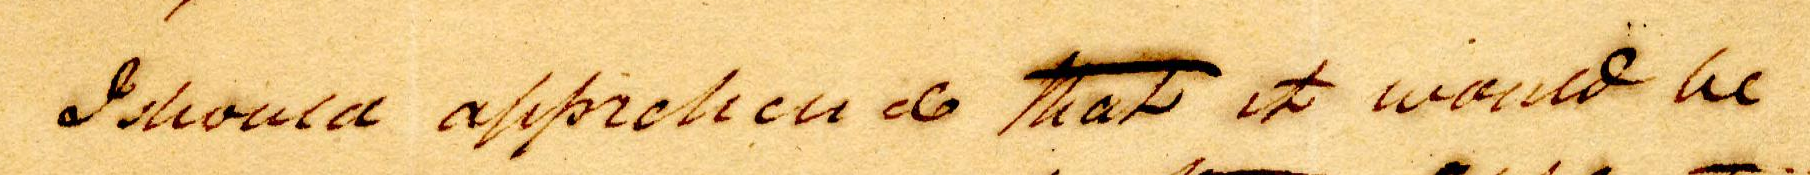I should apprehend that it would be
